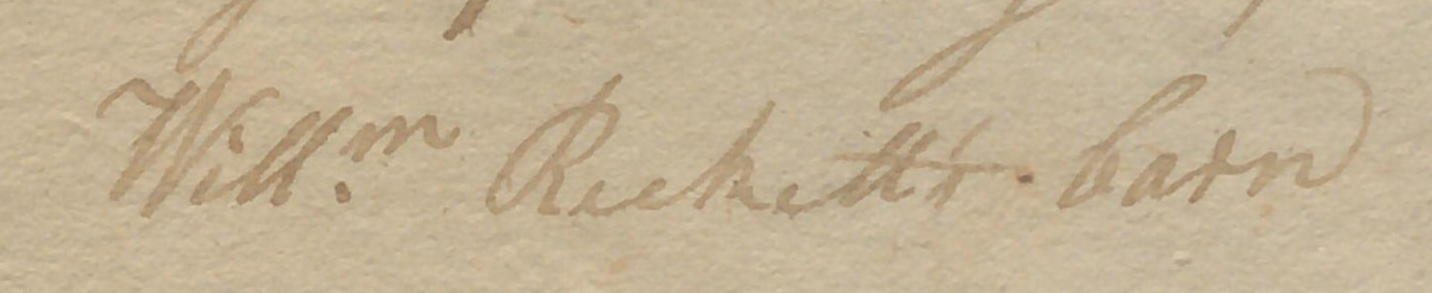Will^m. Rickett's barn
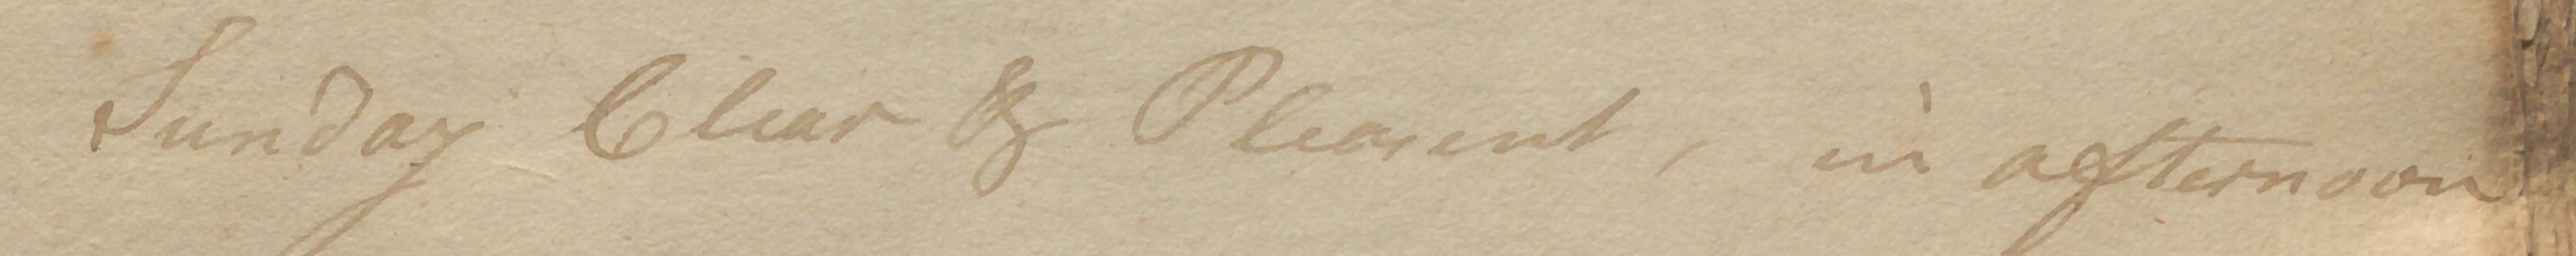Sunday Clear & Pleasent, in afternoon
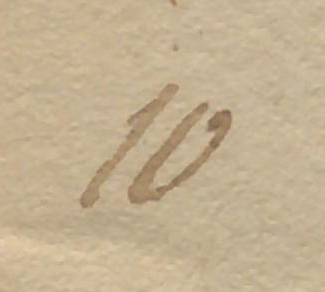10
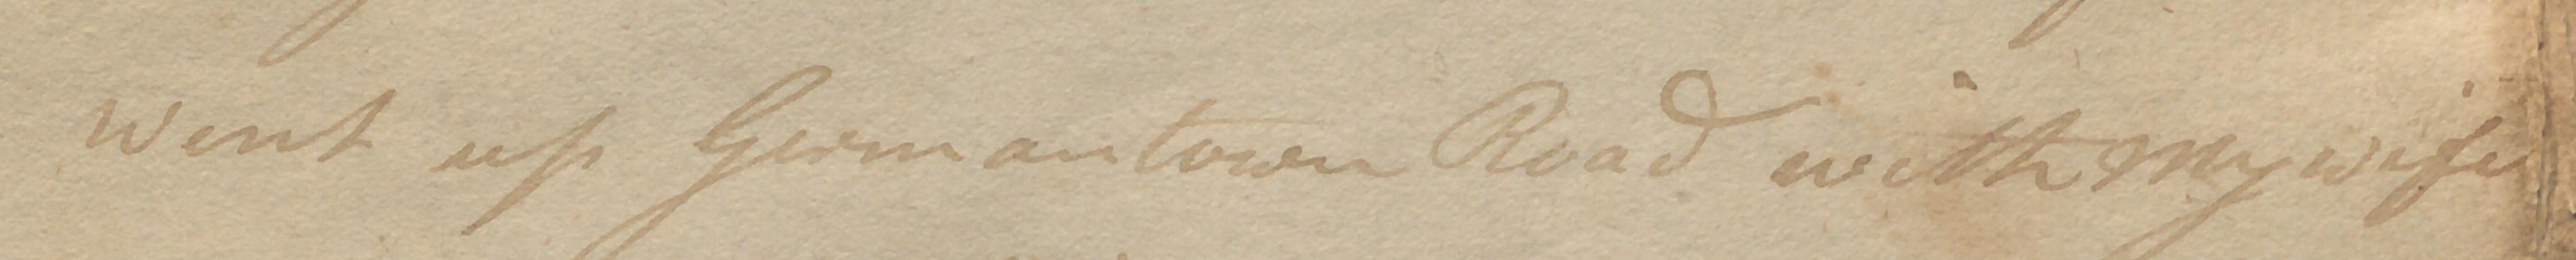went up Germantown Road with my wife
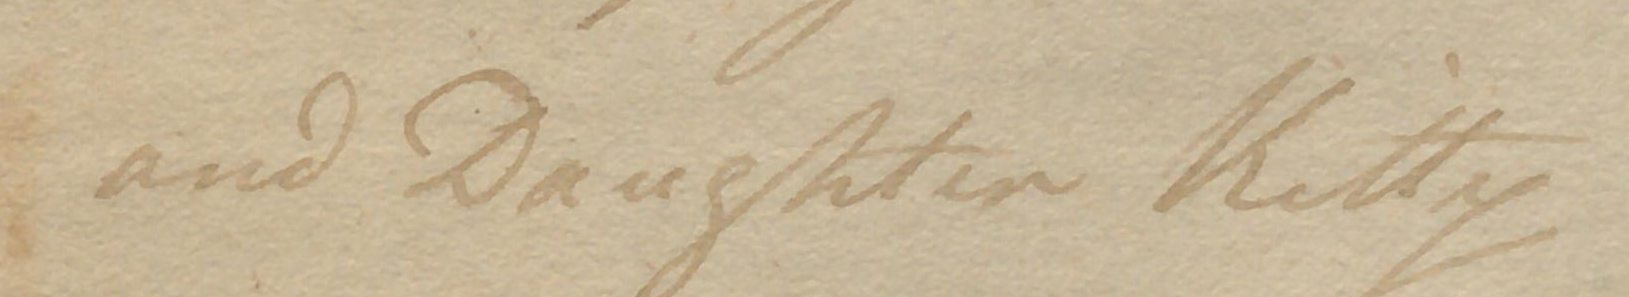and Daughter Kitty
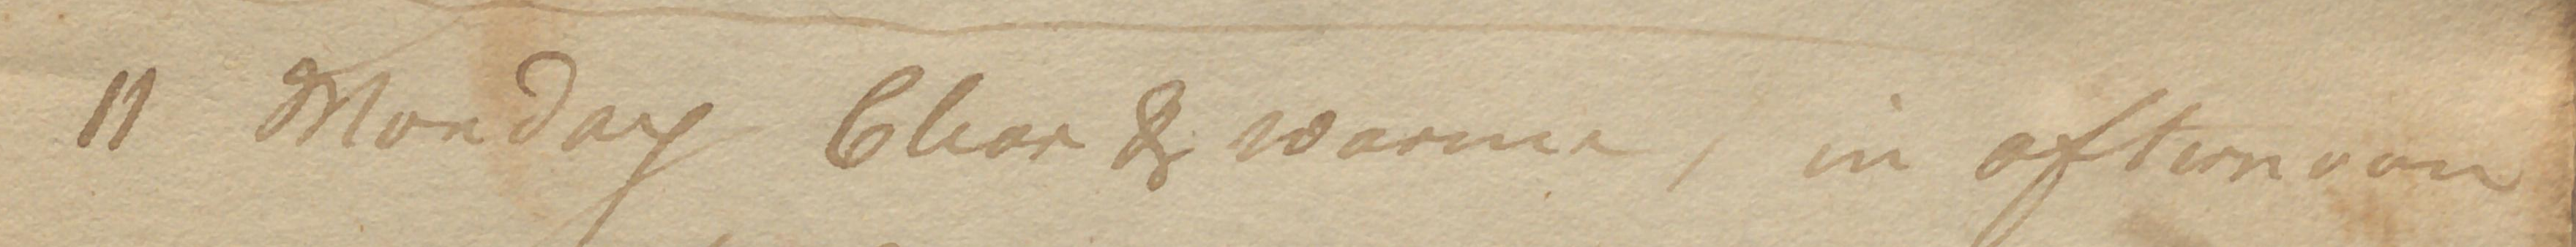11 Monday Clear & warme, in afternoon
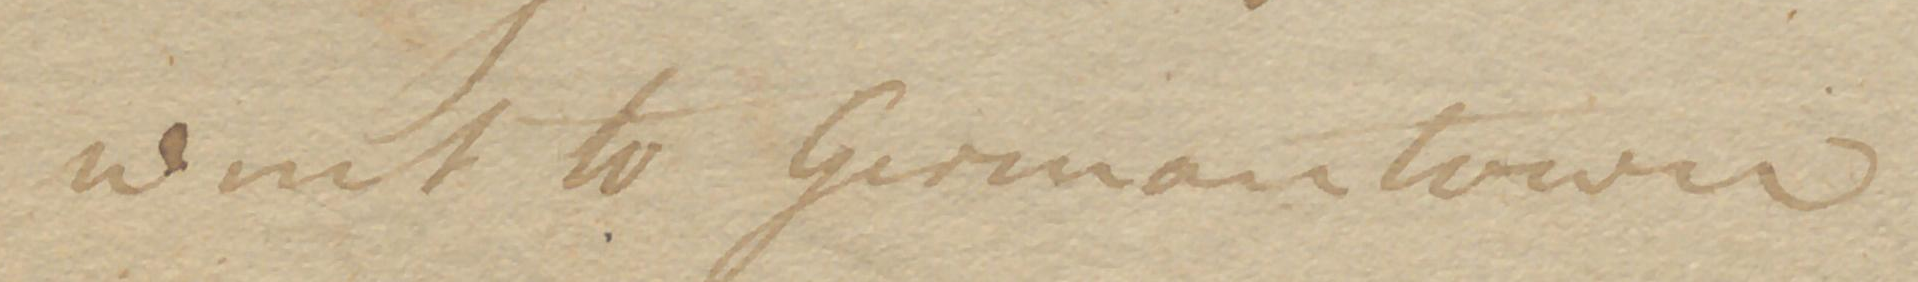went to Germnantown
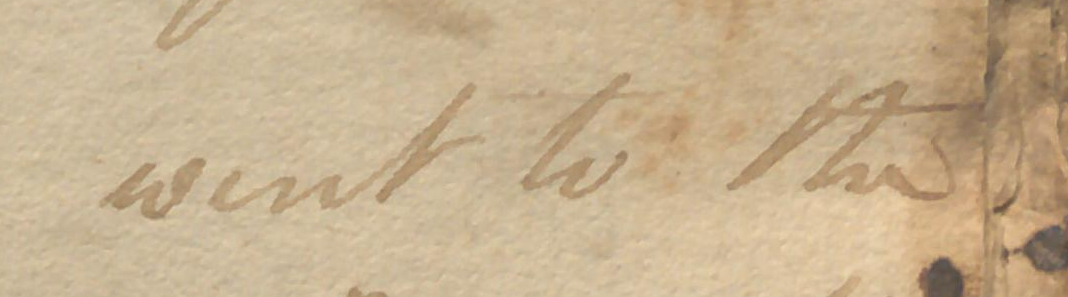went to the
